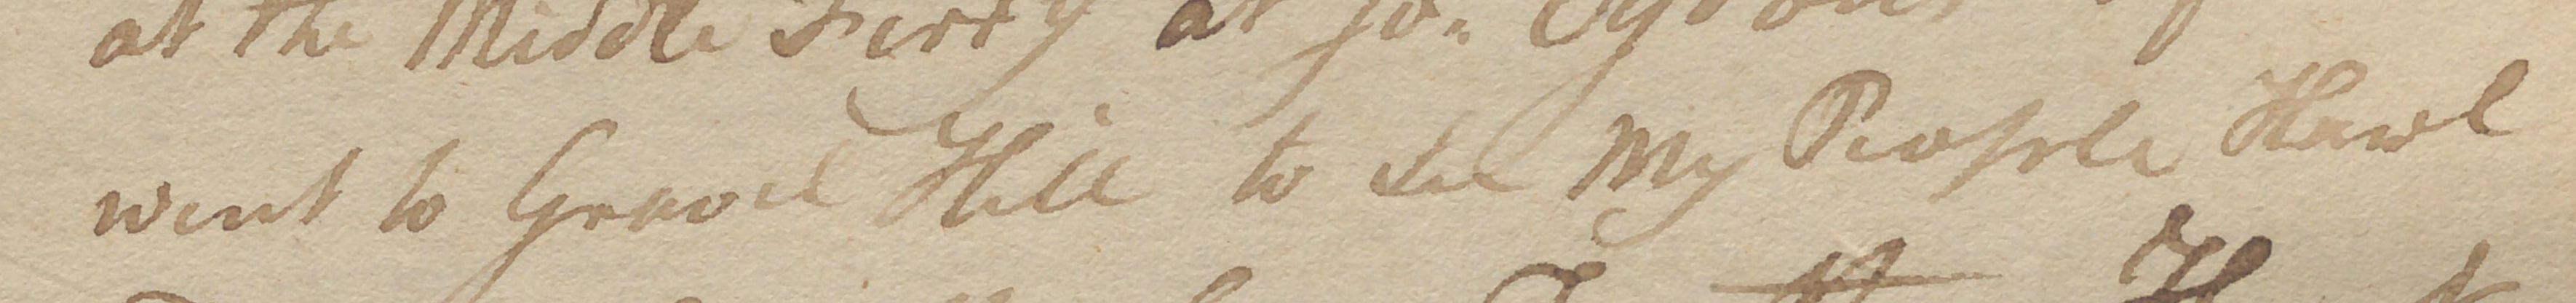went to Gravel Hill to see My People Hawl
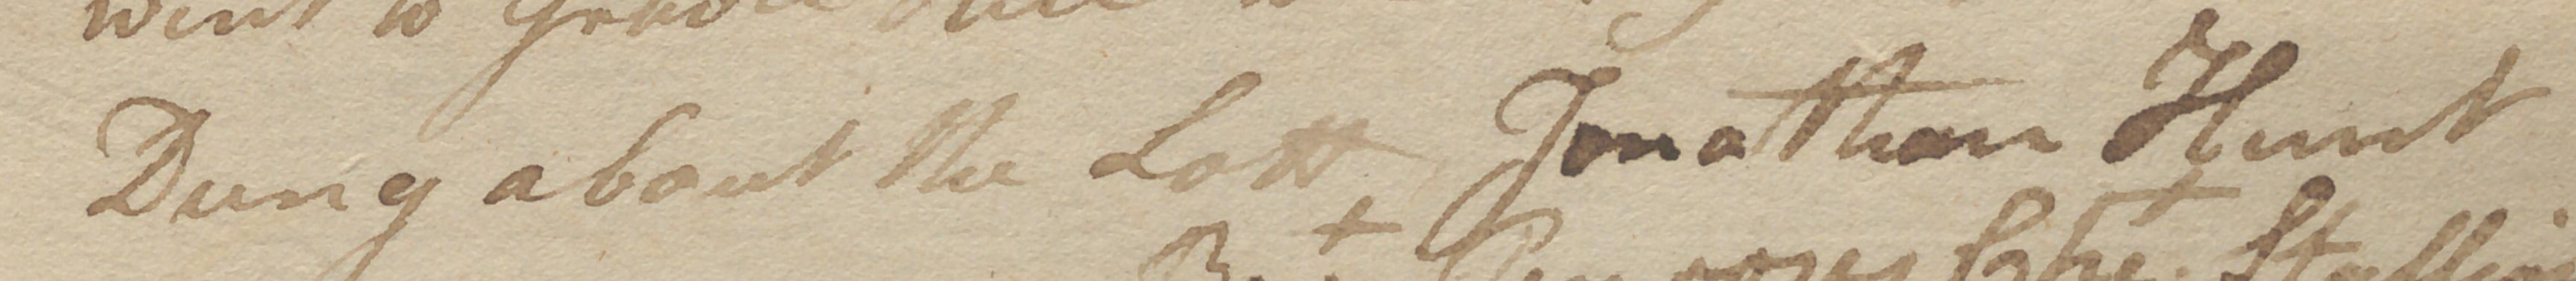Dung about the Lott Jonathan Hunt
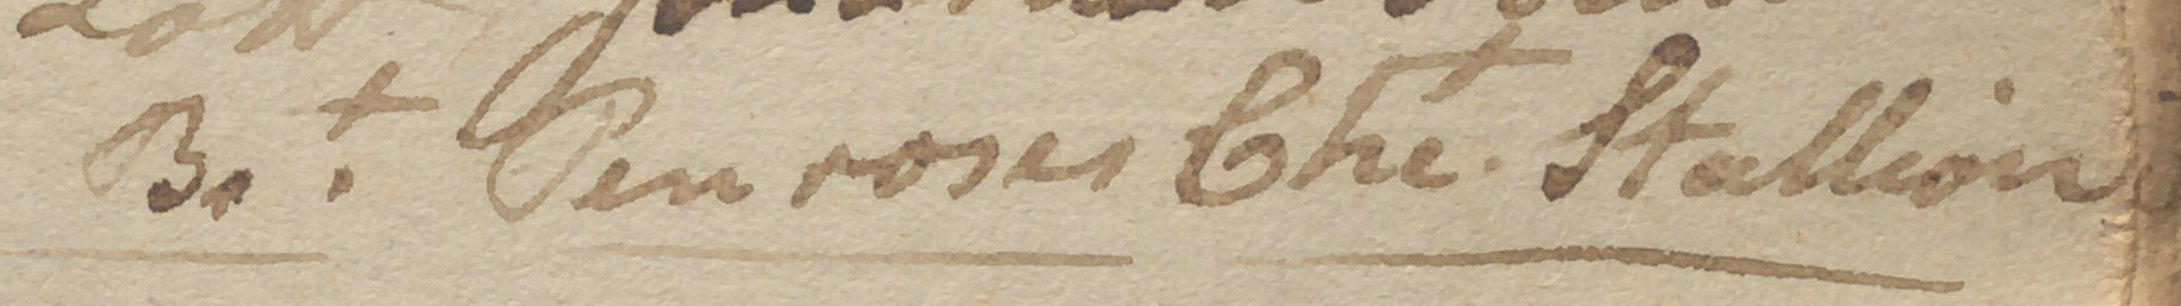Br^t. Penroses Che^t. Statlion
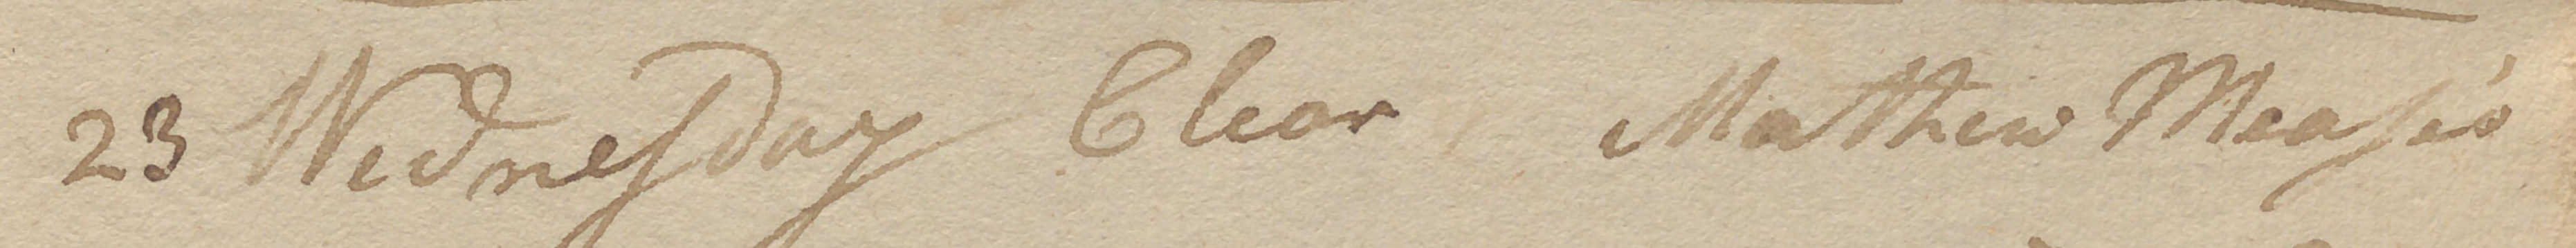23 Wednesday Clear Mathew Meases
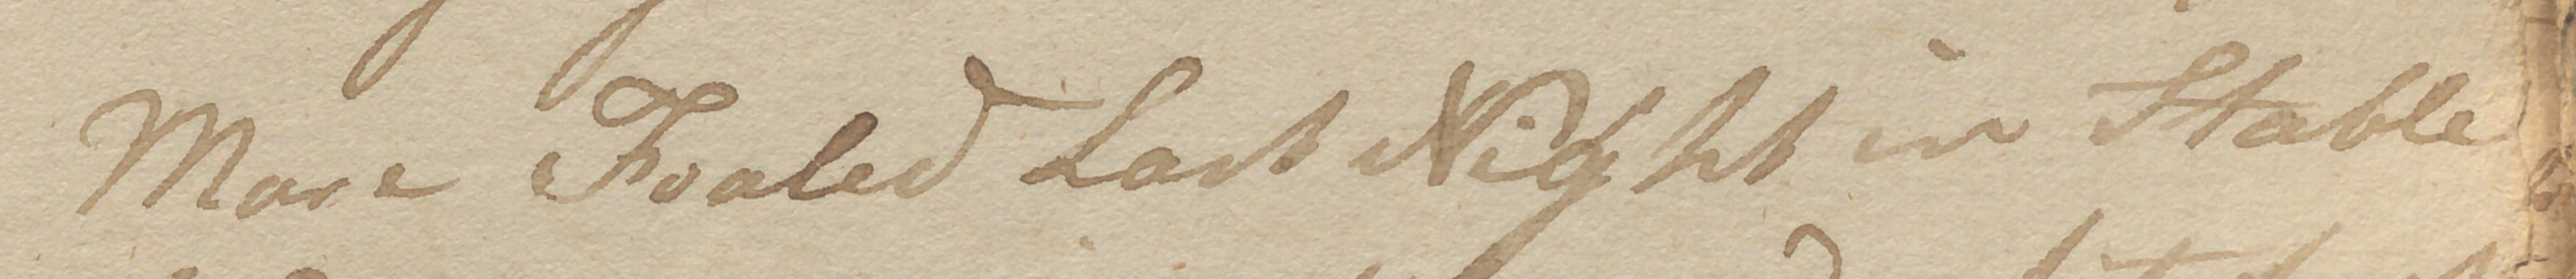Mare Foaled Last Night in Stable
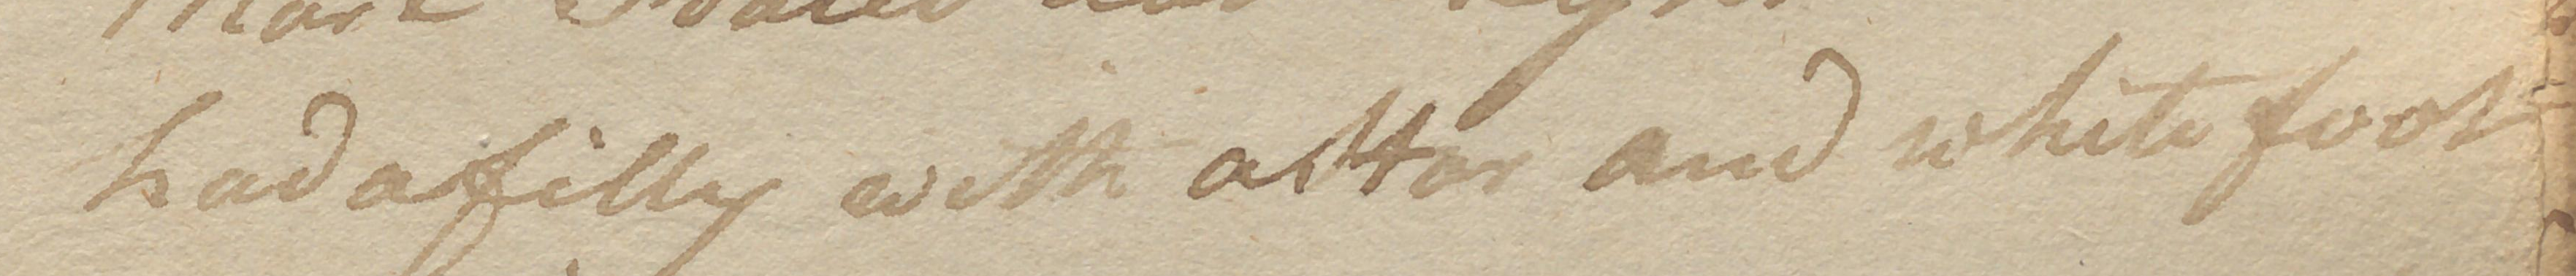had a filly with aster and white foot
